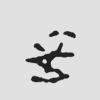是
